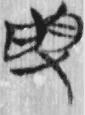受
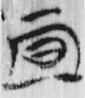○（期）
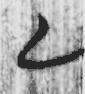乙
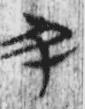丑
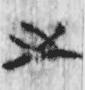之
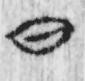日
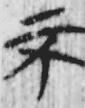不
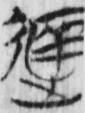𬨭（將）
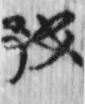○（鄢）
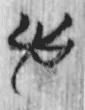左
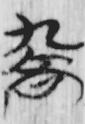喬
